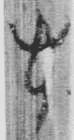心
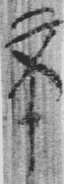不
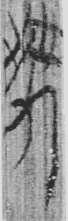○（勝）
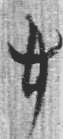心
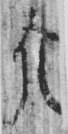大
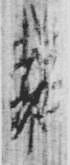○（亂）
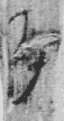乃
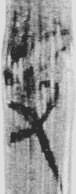拃（作）
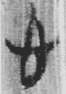心
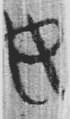女（如）
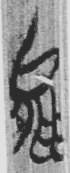能
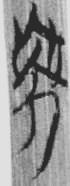○（勝）
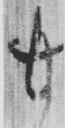心
